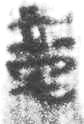章
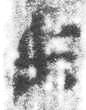與（與）
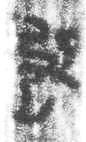節
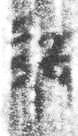幾
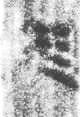夜
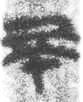不
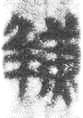難
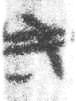女（如）
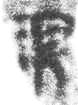果
